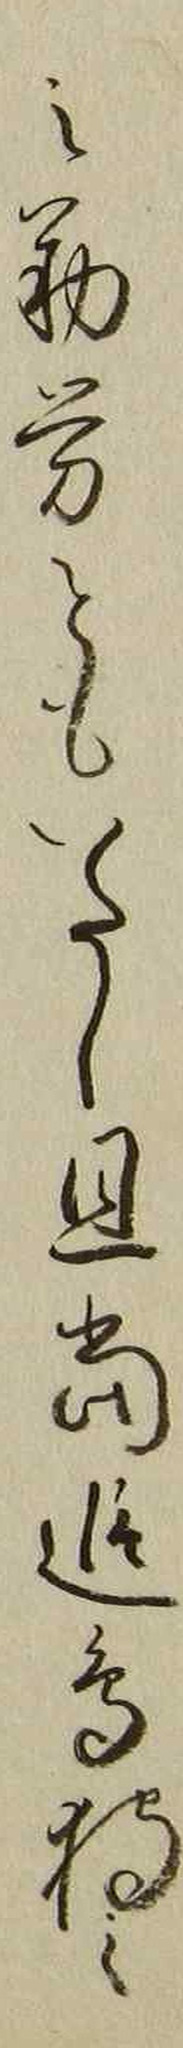の勤労をもいたし且当追鳥狩の
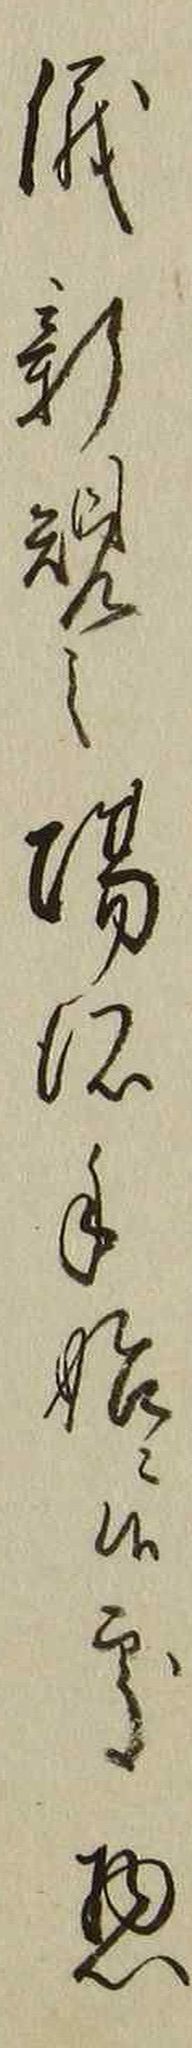儀新規の場所手始に候処惣
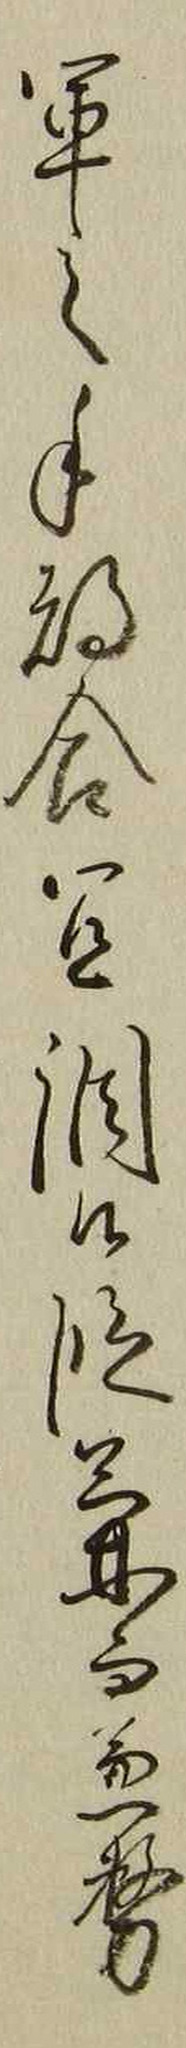軍の手都合宜調候段兼而兼務
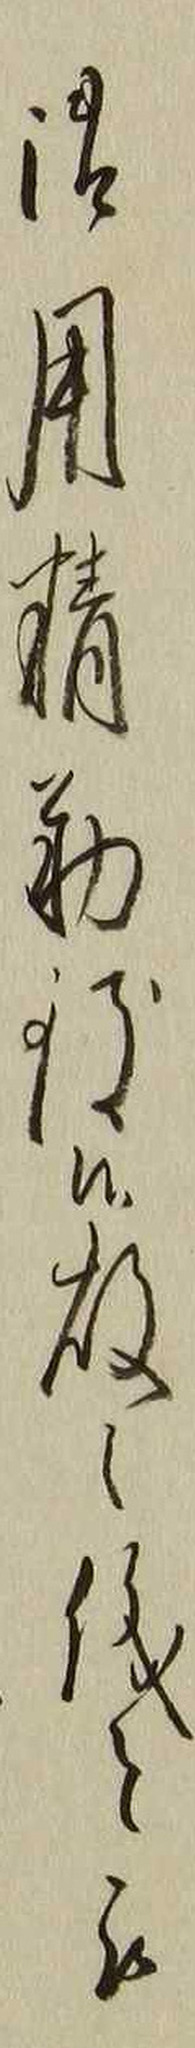御用精勤致候故の儀と被
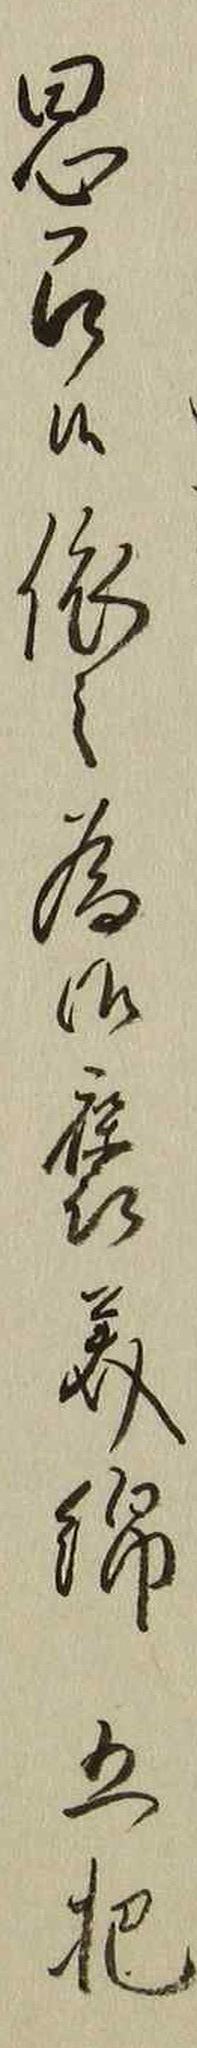思召候依之為御褒美綿五把
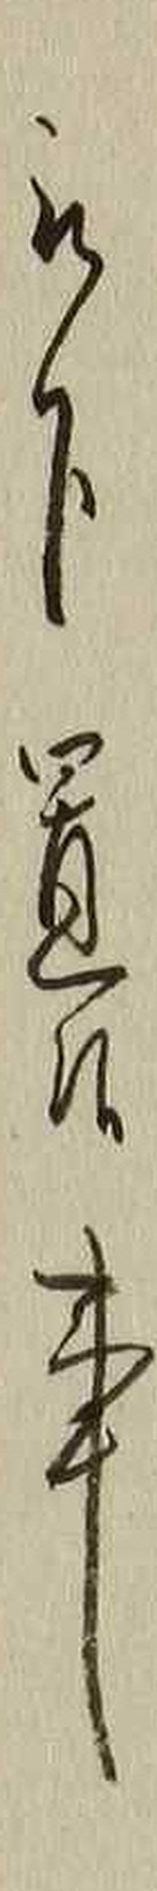被下置候事
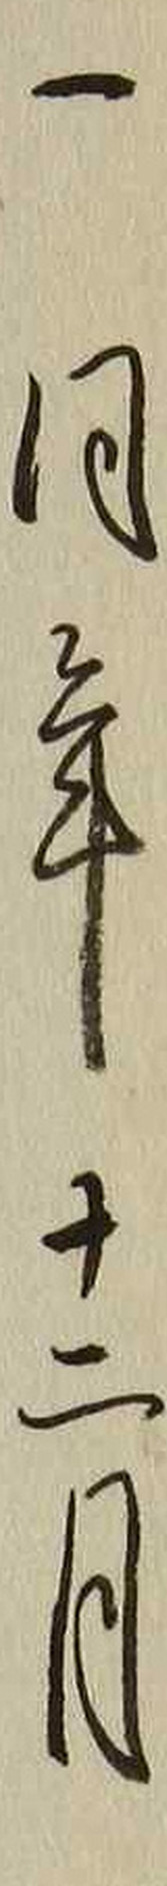一同年十二月
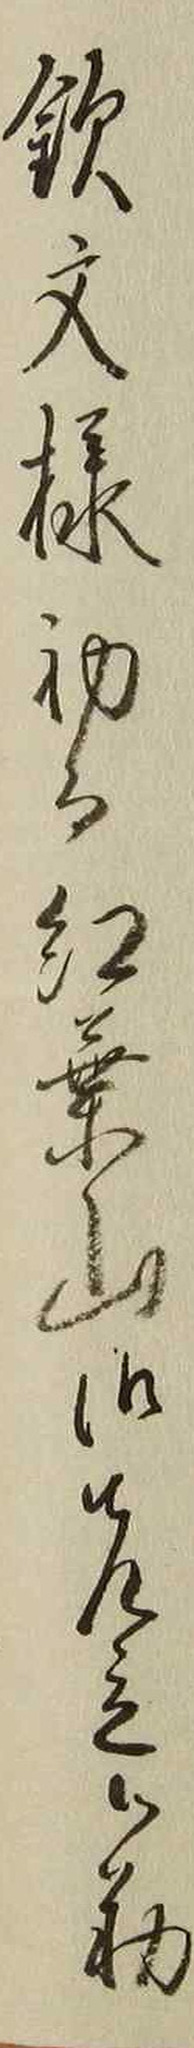欽文様初而紅葉山御先立御勤
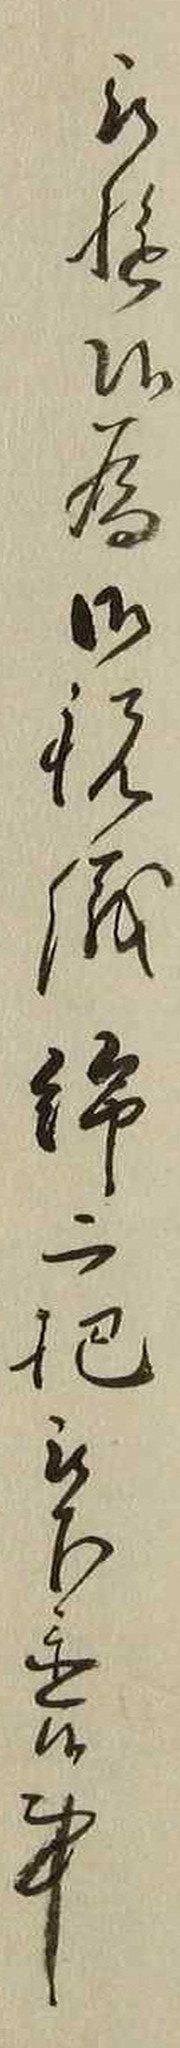被遊候為御祝儀綿二把被下置候事
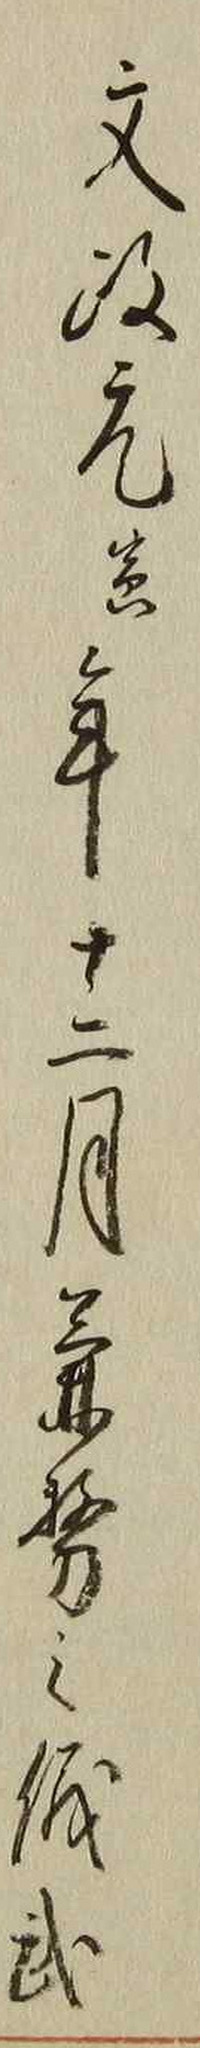一文政元寅年十二月兼務の儀武
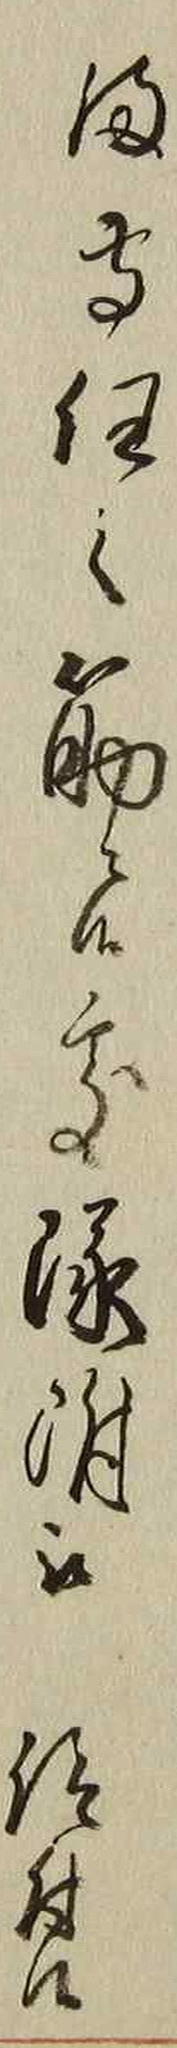備守任の筋に候処隊附被仰付候
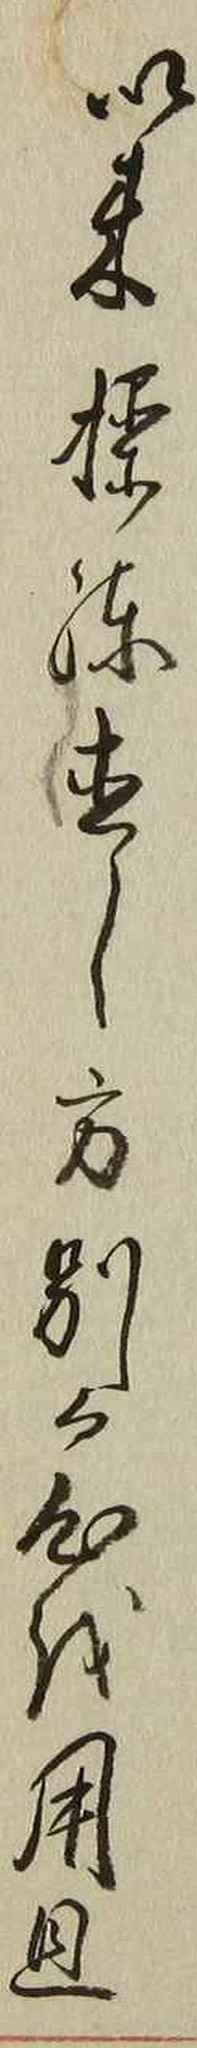以来操練直し方別而心を用且
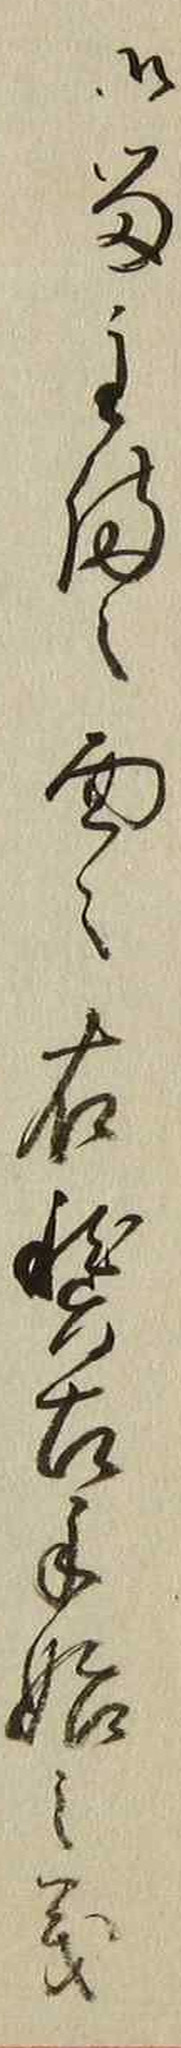御留主備の面々右稽古手始の義
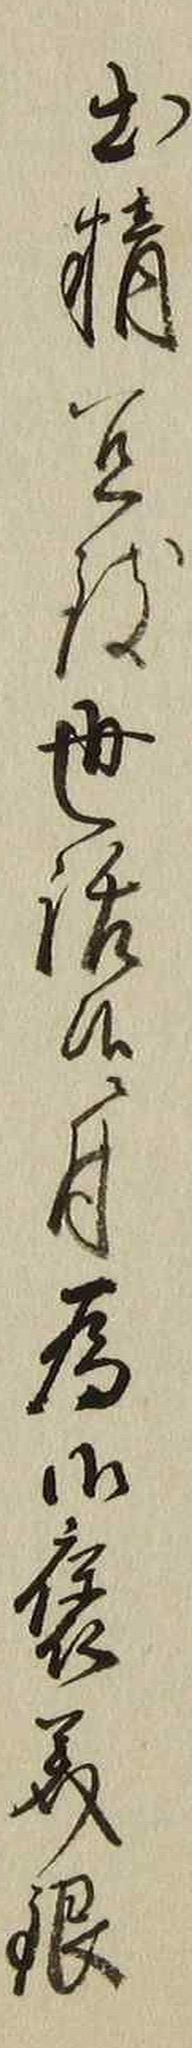出精宜致世話候に付為御褒美銀
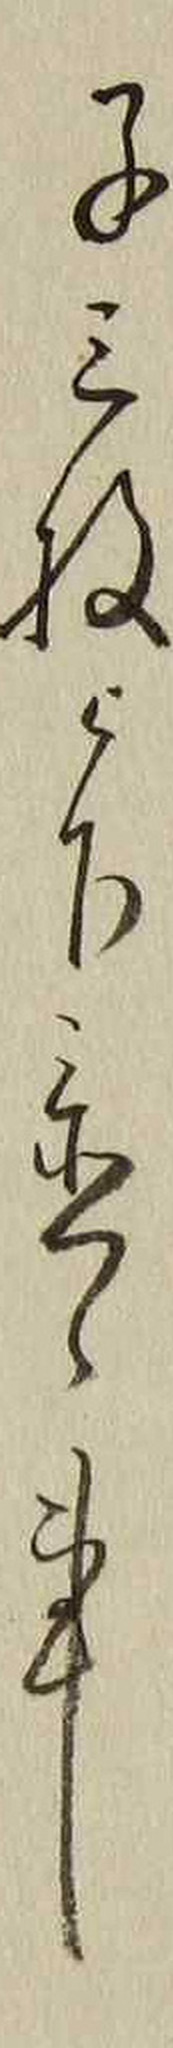子三枚被下置候事
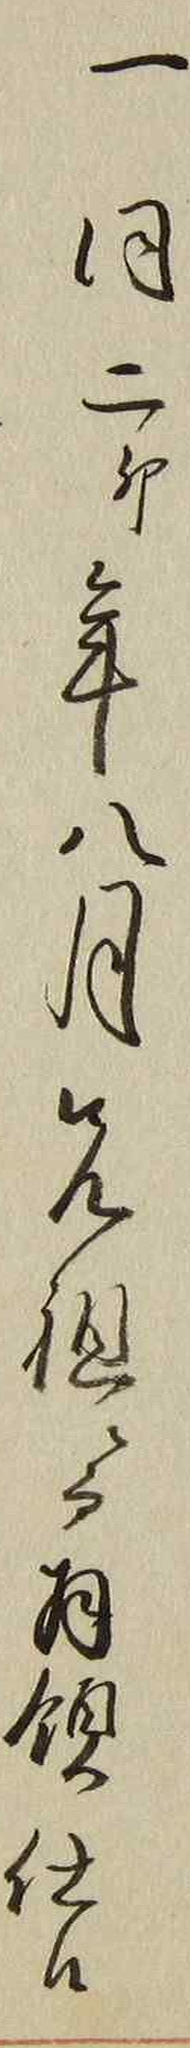一同二卯年八月先祖に而拝領仕候
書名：諸士系譜　巻之1　い之部1
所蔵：会津若松市立会津図書館
